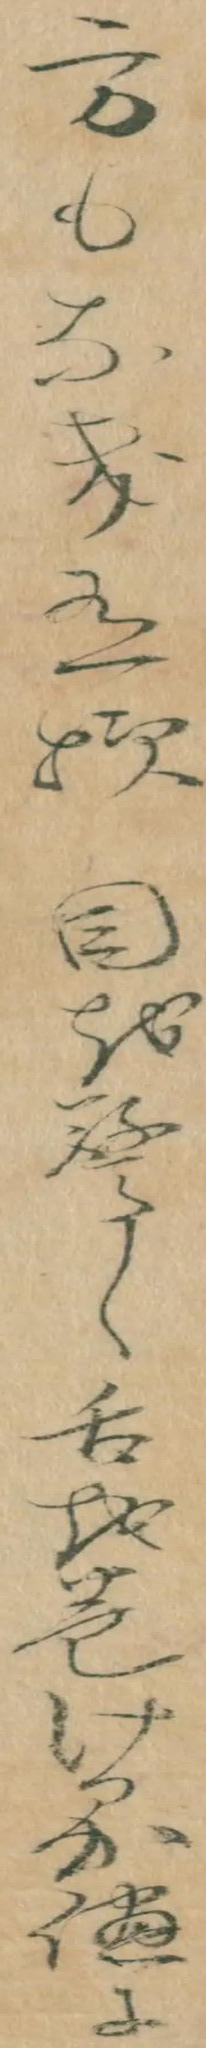方もなき有様目を懸たし舌を巻けるか儘に
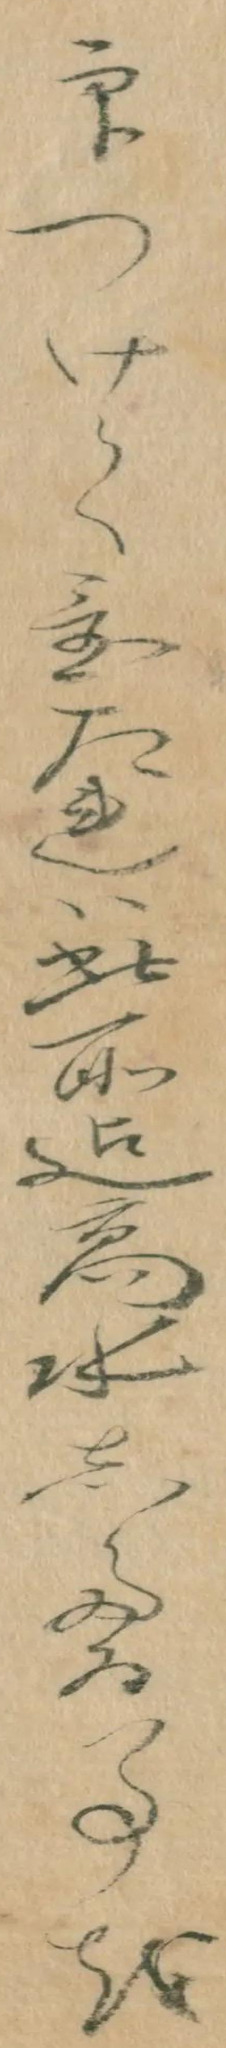印つけて置たれは此所迄高水したる事を
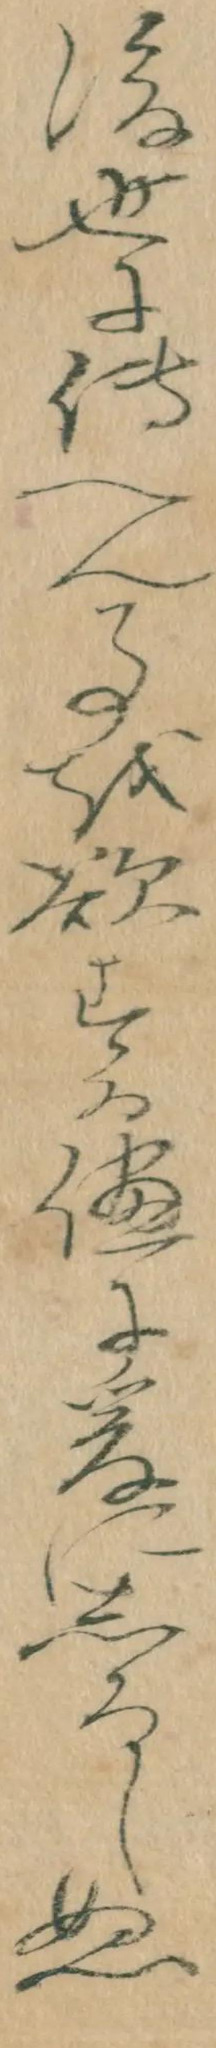後世につ伝へん事を欲する儘に爰にしるしぬ
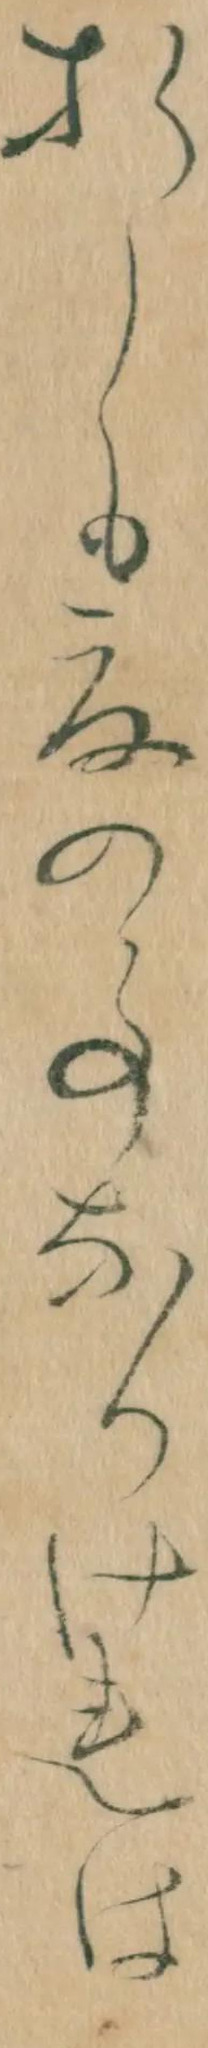折しも夏の事なりけれは
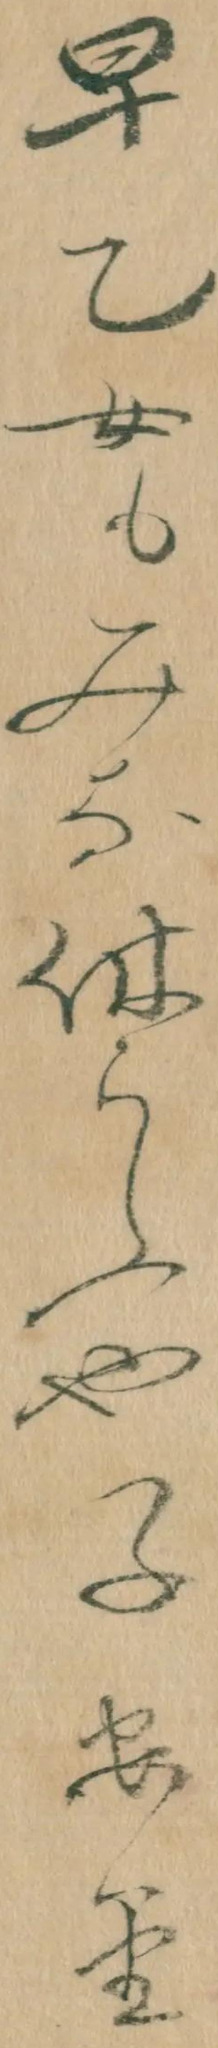早乙女もみな休らふや子安堂
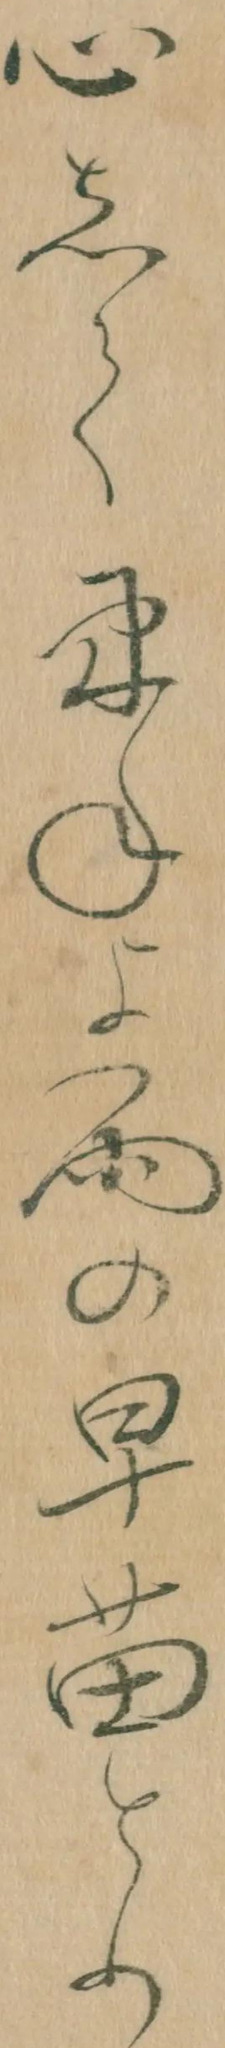心して束ねよ雨の早苗とり
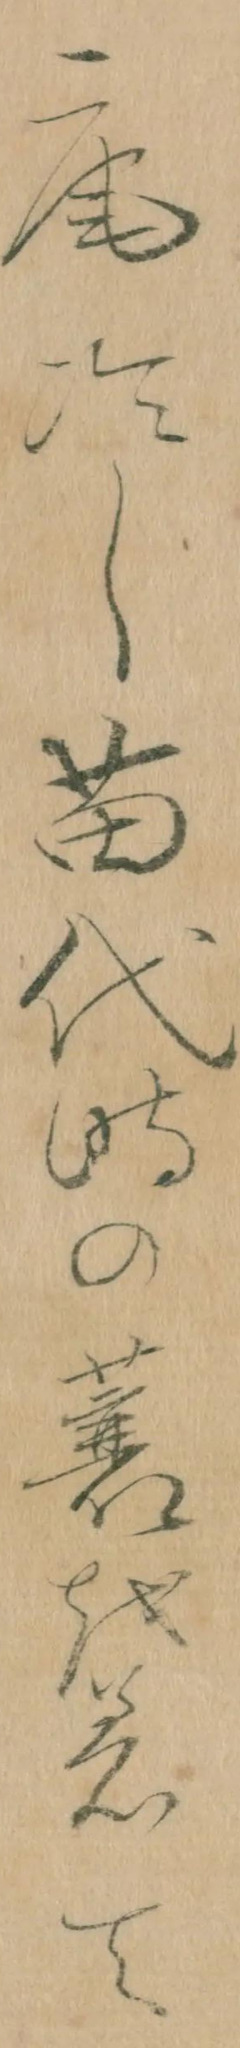庵冷し苗代時の嚢を着て
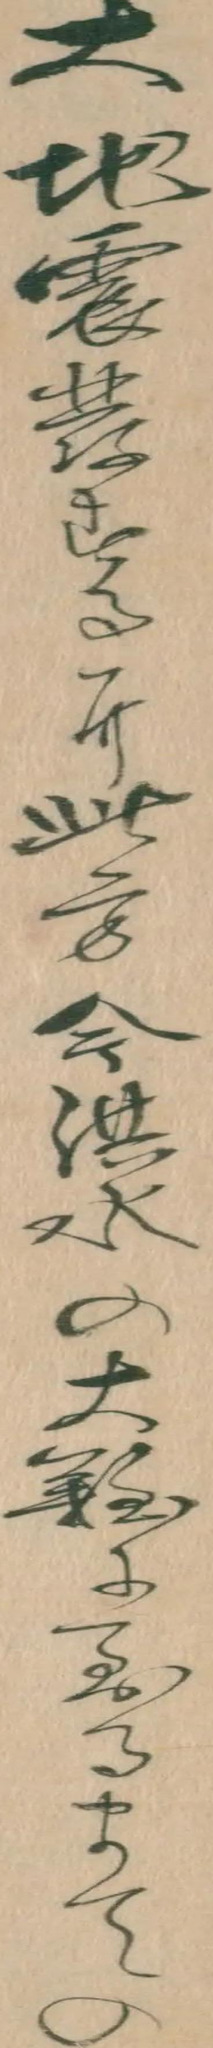大地震発するに此方今洪水の大難に至るまての
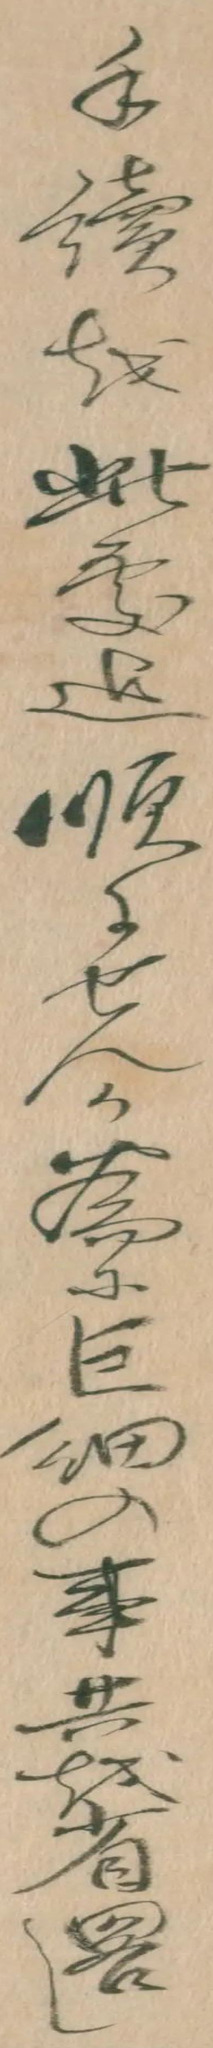手続を此處迄順にせんか為に巨細の事共を省略し
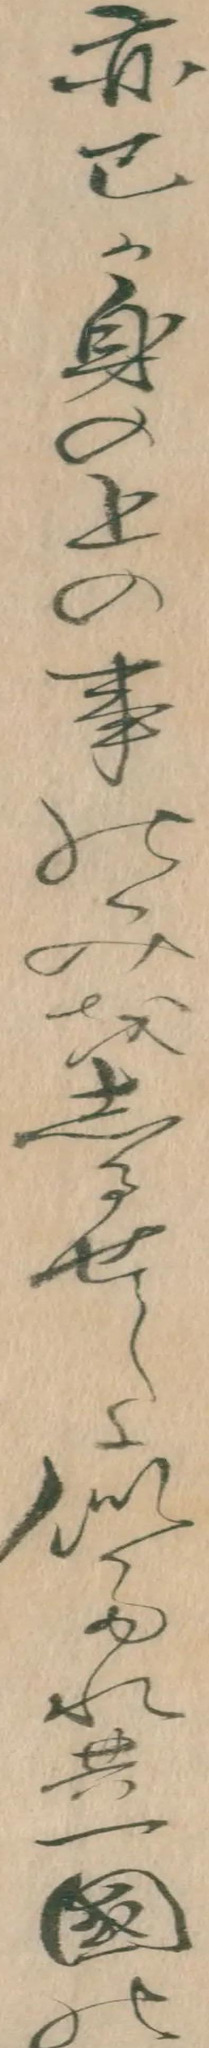亦己の身の上の事のみをしるせしに似たれ共一国の
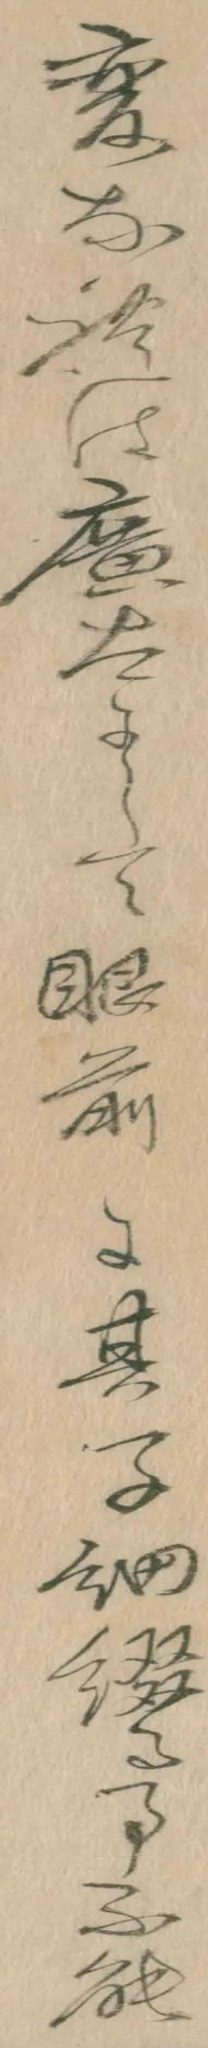変なれは広太にして眼前に其子細綴る事不能
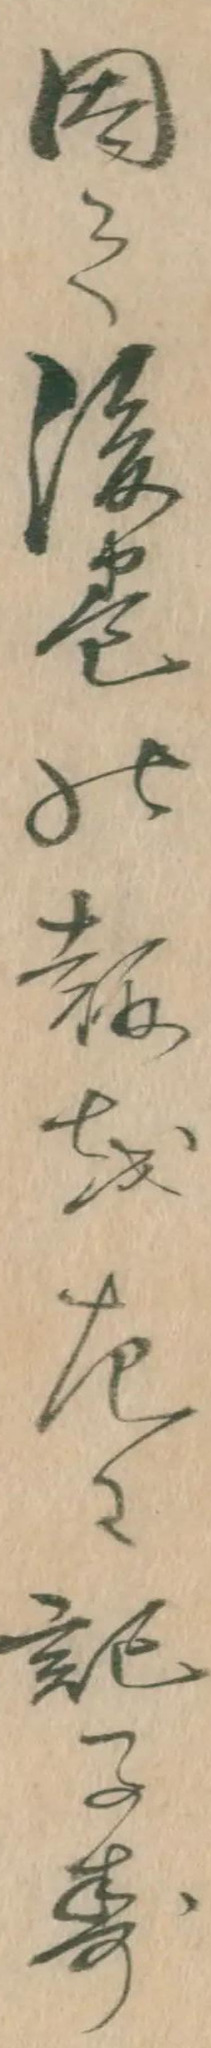因て後巻の報を左に記事す
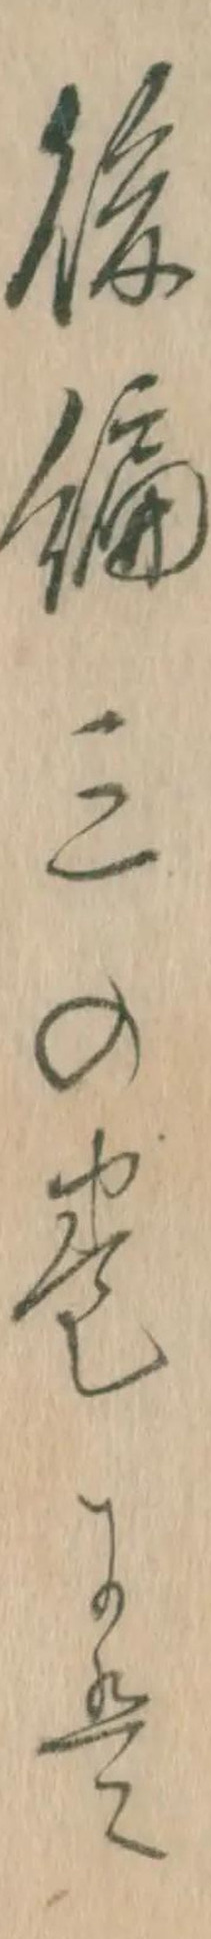後編三の巻には
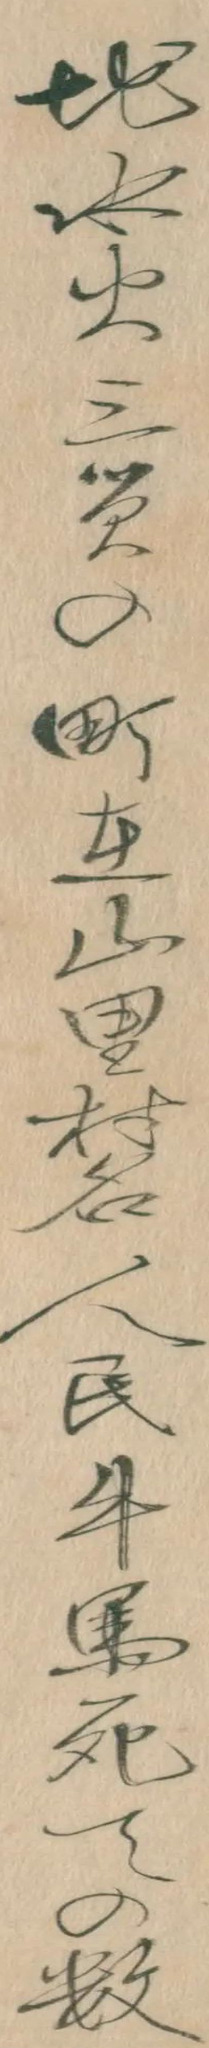地水火三災の町在山里村名人民牛馬死ての数
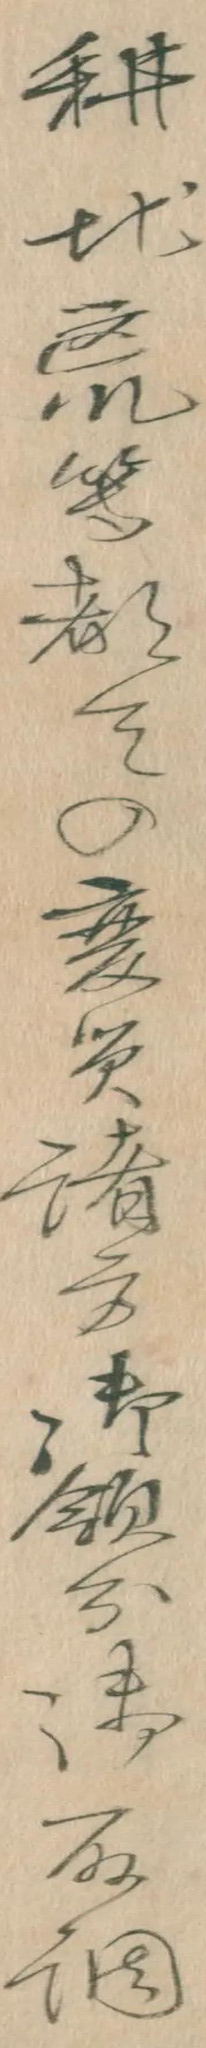耕地荒等都ての変災諸方御領分御取調
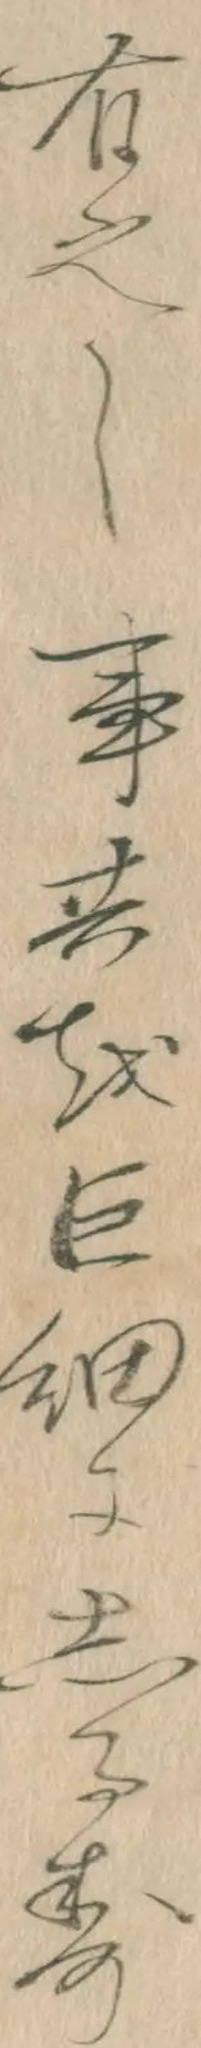有之し事共を巨細にしるす
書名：俗語之種. [7]
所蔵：国立国会図書館 National Diet Library, JAPAN
